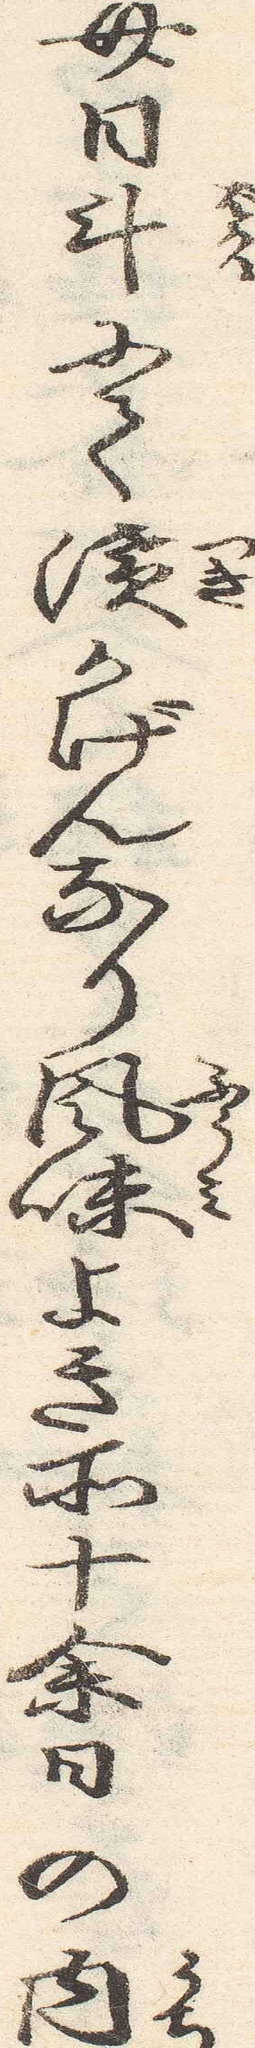廿日斗にて漬かげんなり風味よき所十余日の内
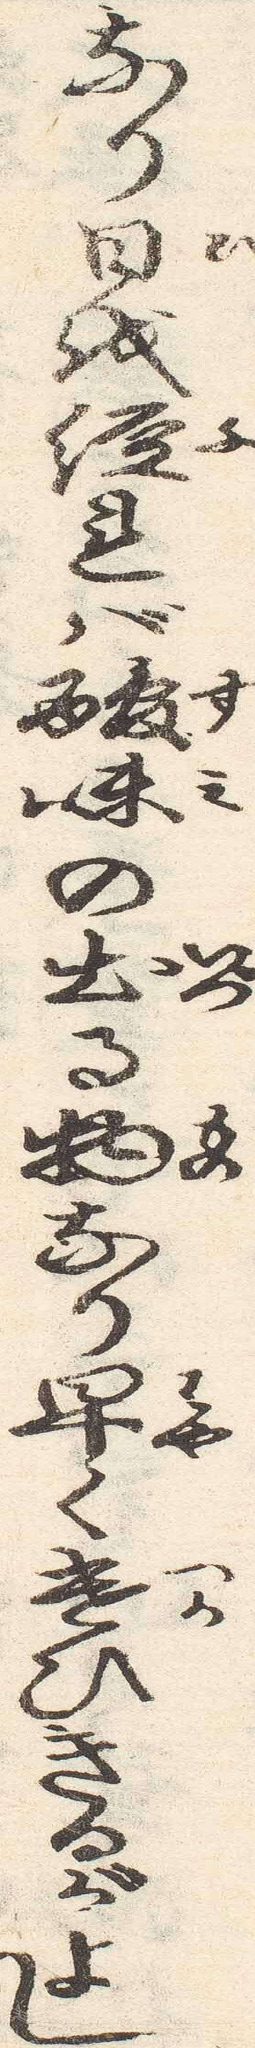なり日を経れば酸味の出る物なり早く遣ひきるがよし
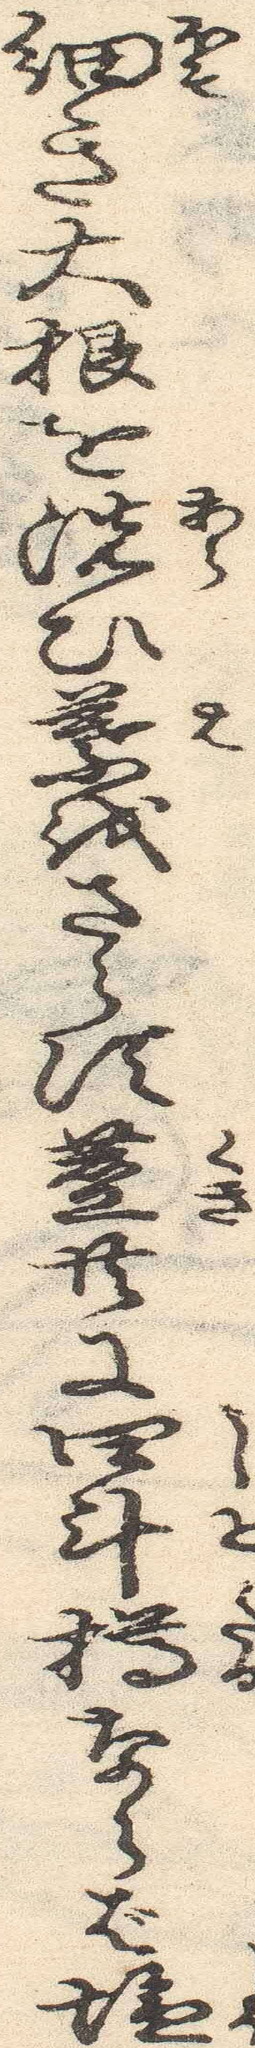細き大根を洗ひ葉をさらず茎共に四斗樽ならば塩
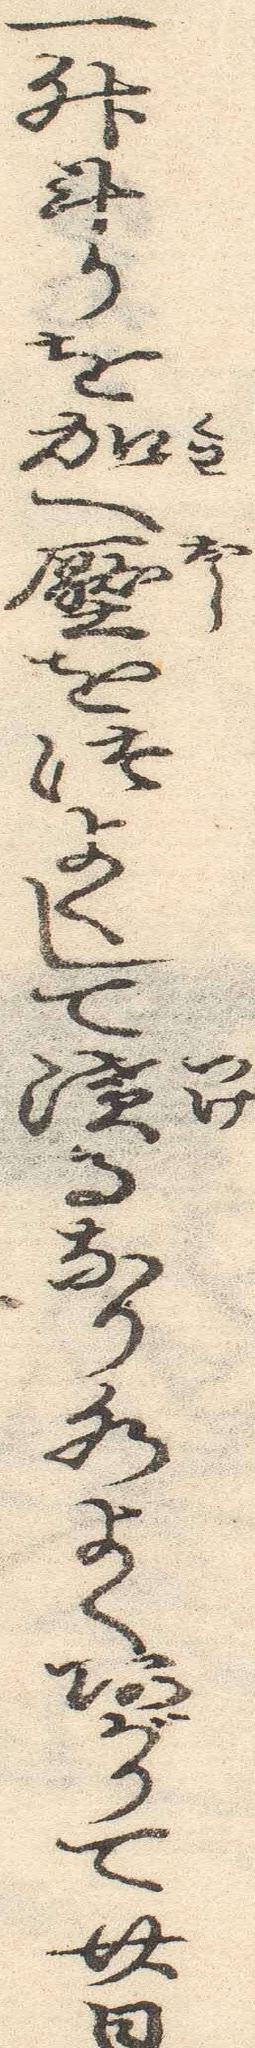一升斗りを加へ圧をつよくして漬るなり水よくあがりて廿日
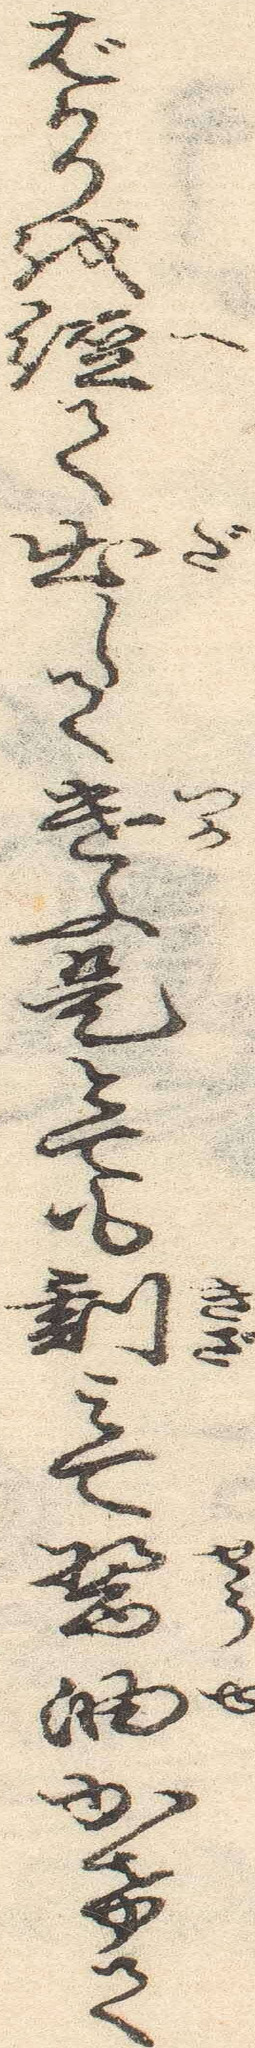ばかりを経て出して遣ふ是とても刻みて醤油かけて
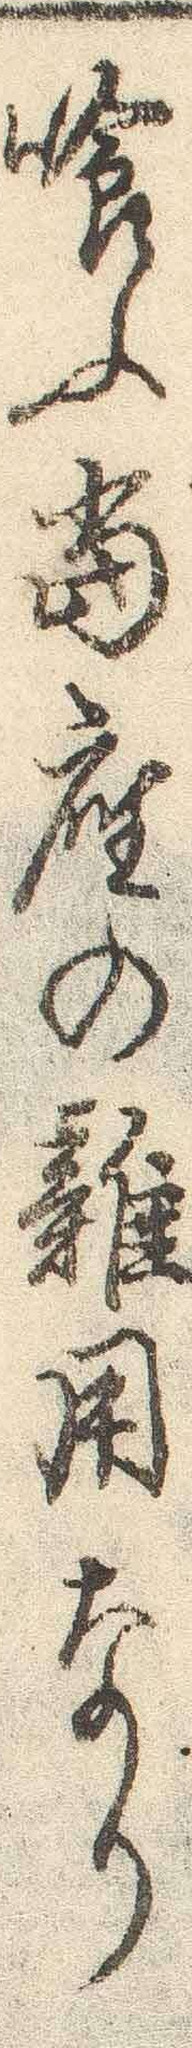喰ふ当座の雑用なり
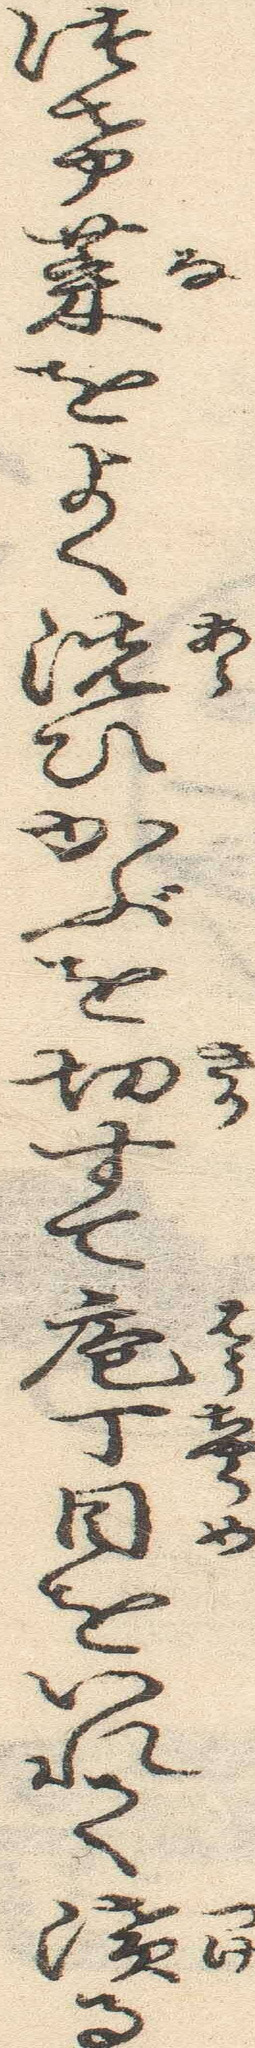つけ菜をよく洗ひかぶを切すて庖丁目をいれて漬る
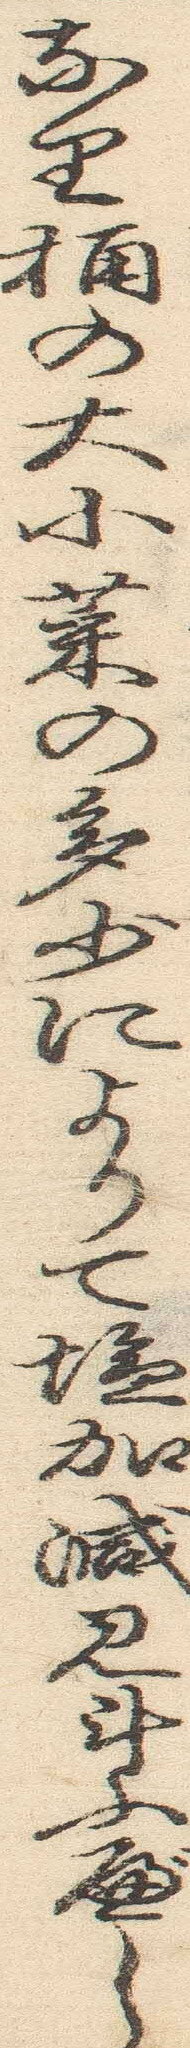なり桶の大小菜の多少によりて塩加減見斗ふべし

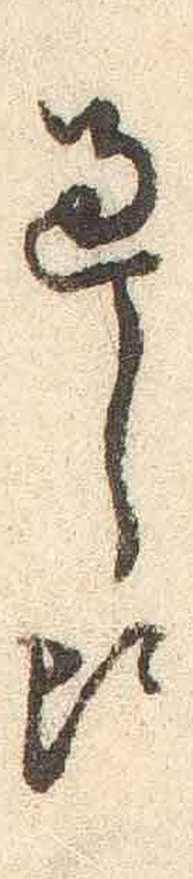過し頃
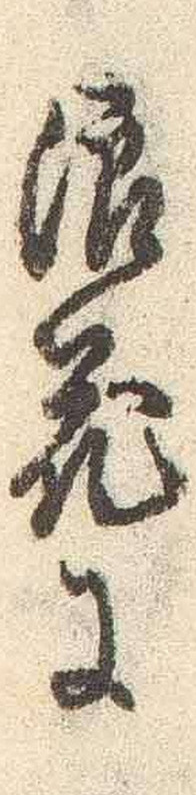浪花に
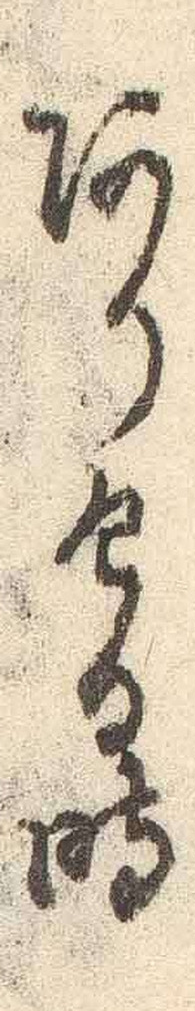ありける時
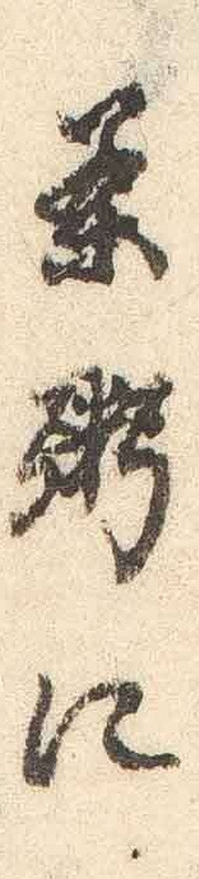茶粥に
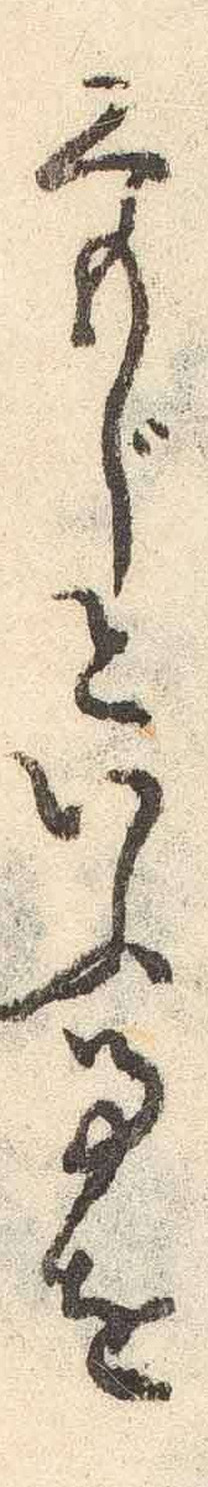みもじといふ事を
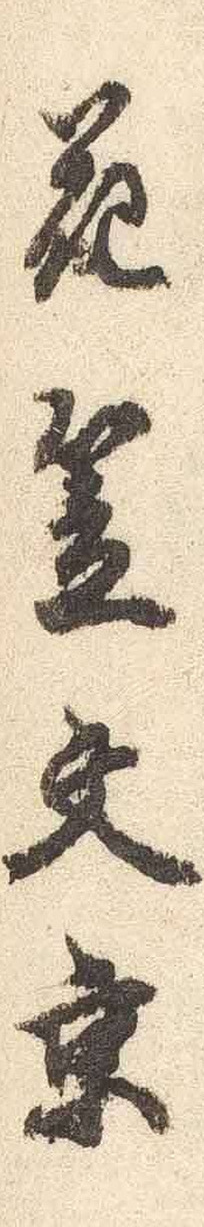花笠文京
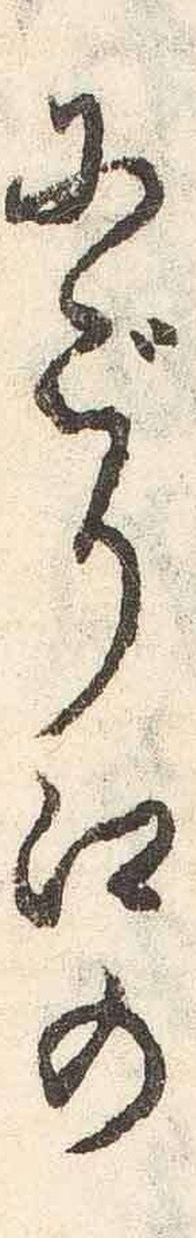にごりえの
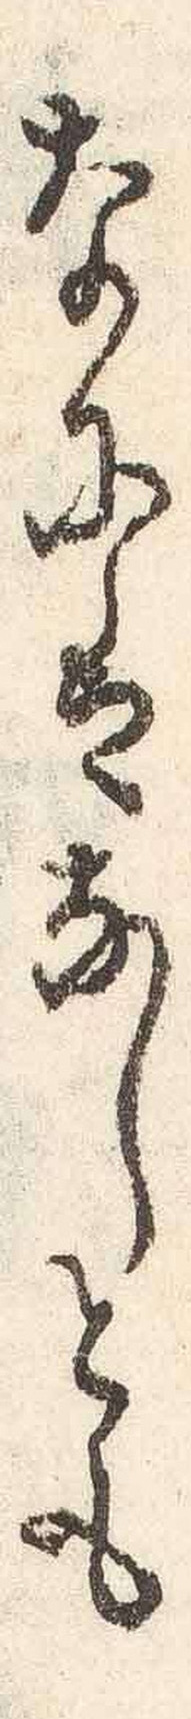なにはなしとも
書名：四季漬物塩嘉言
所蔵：東京学芸大学附属図書館 国文学研究資料館
